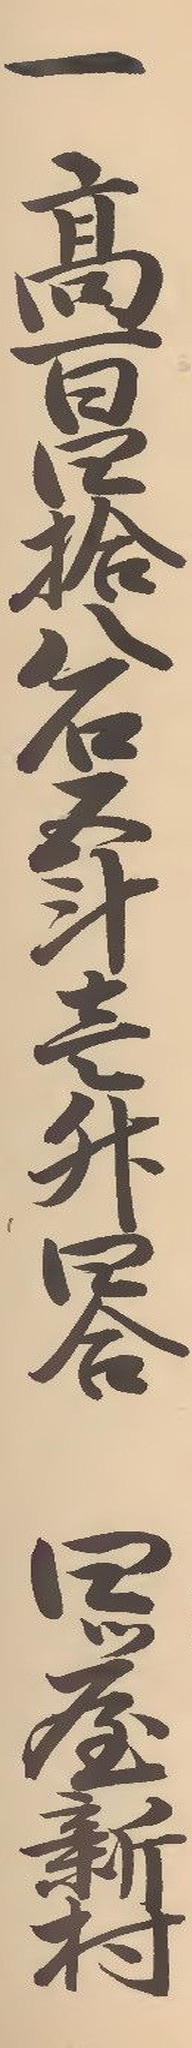一高百四拾八石五斗壱升四合四ッ屋新村
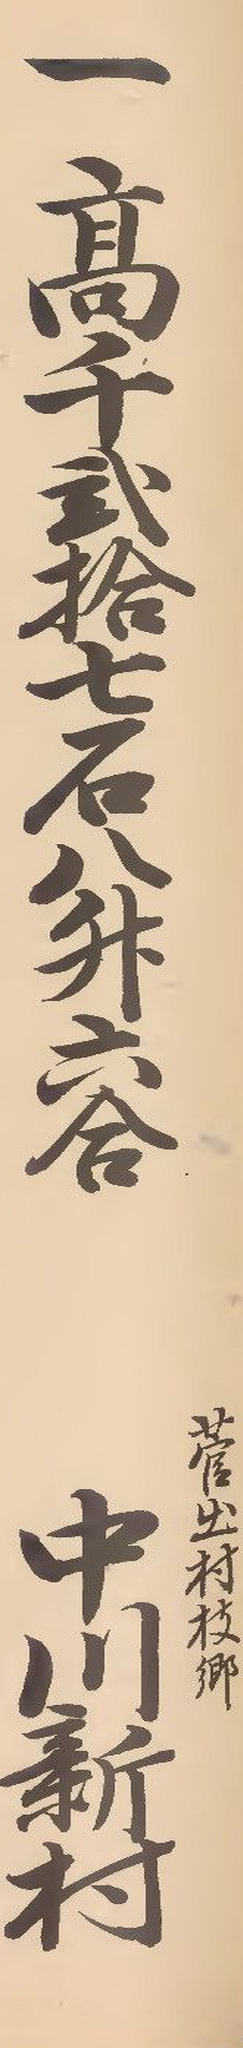一高千弐拾七石八升六合中川新村
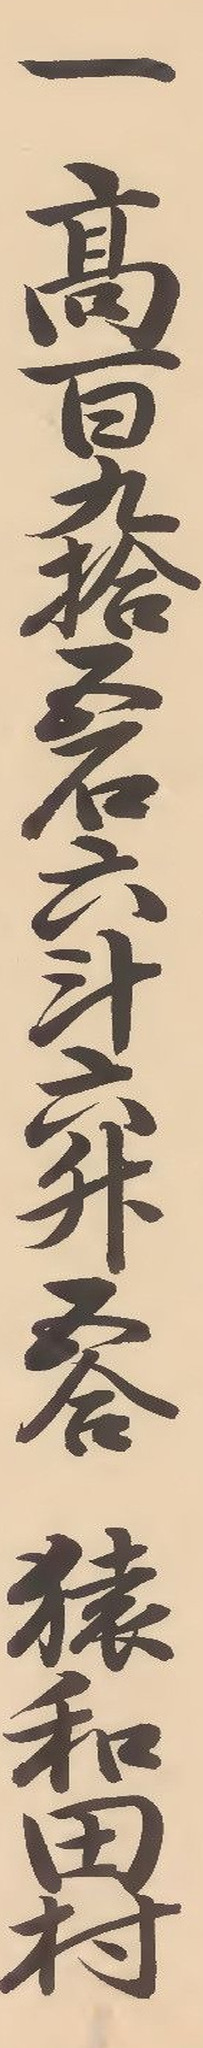一高百九拾五石六斗六升五合猿和田村
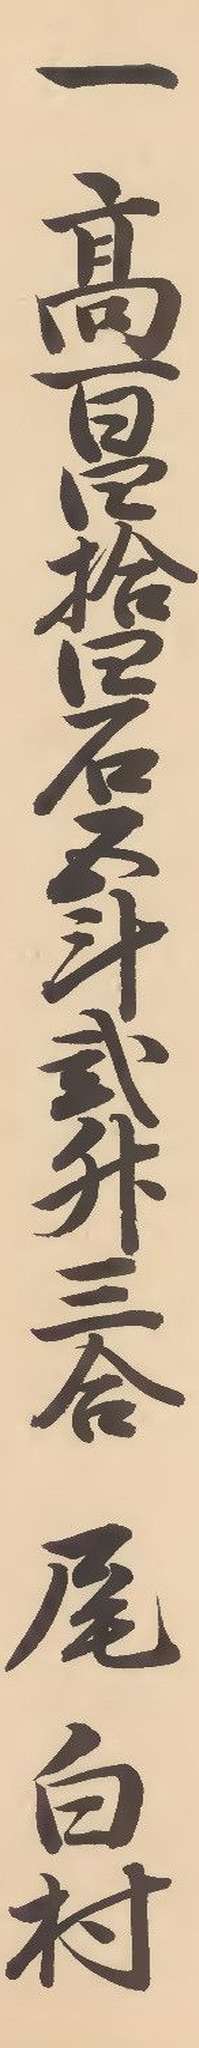一高百四拾四石五斗弐升三合尾白村
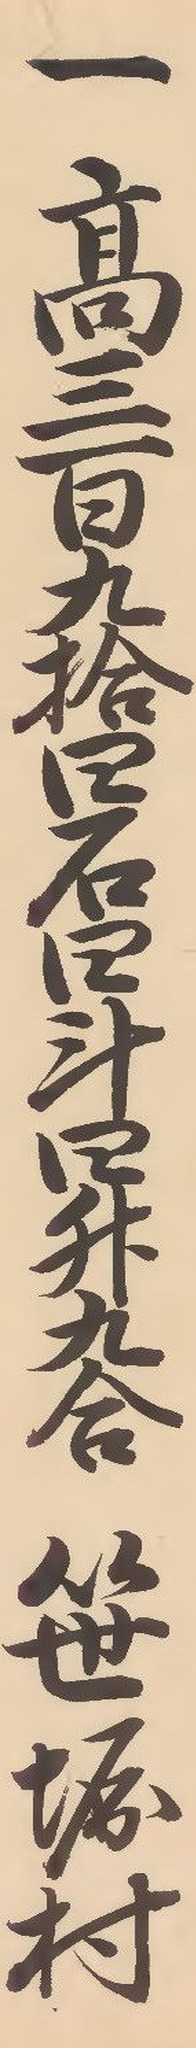一高三百九拾四石四斗四升九合笹堀村

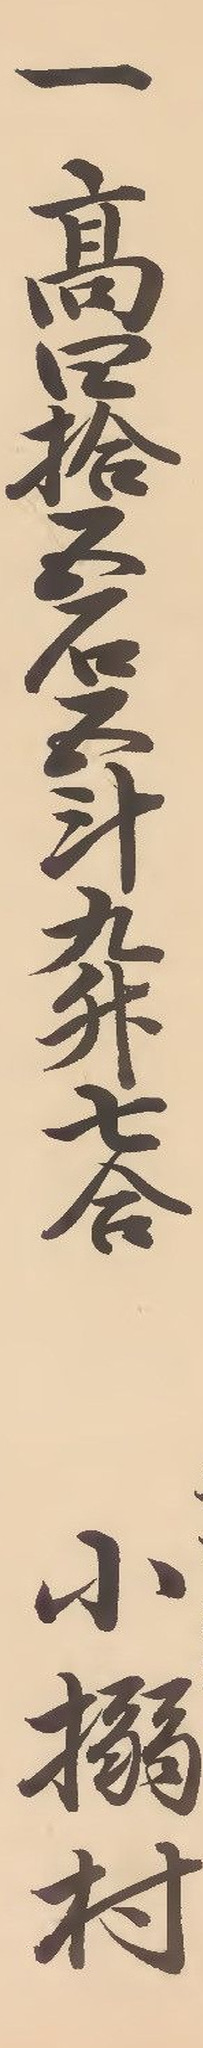一高四拾五石五斗九升七合小搦村
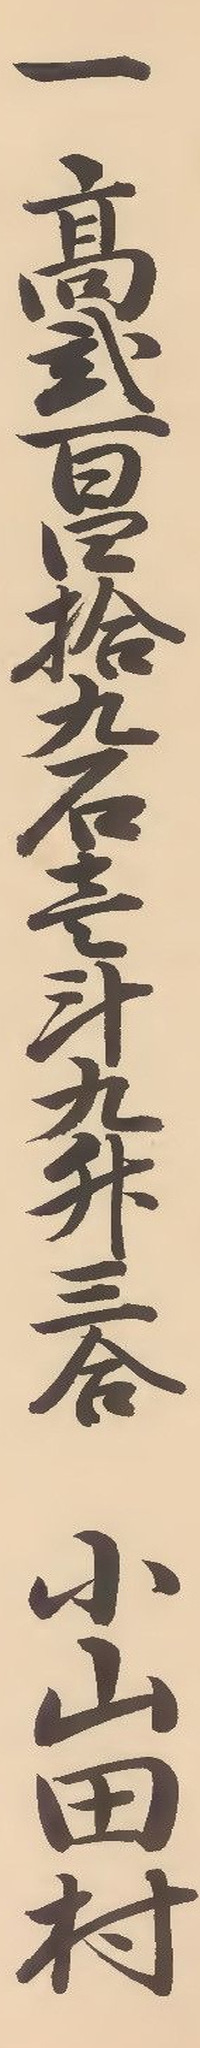一高弐百四拾九石壱斗九升三合小山田村
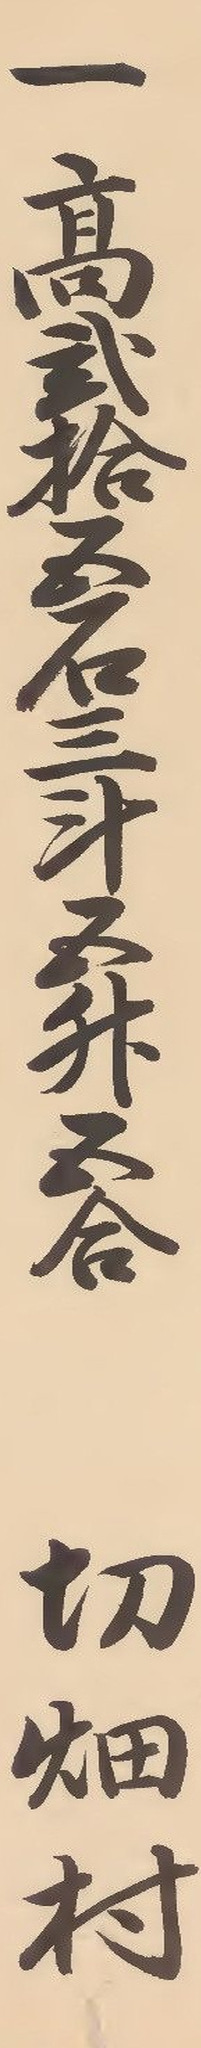一高弐拾五石三斗五升五合切畑村
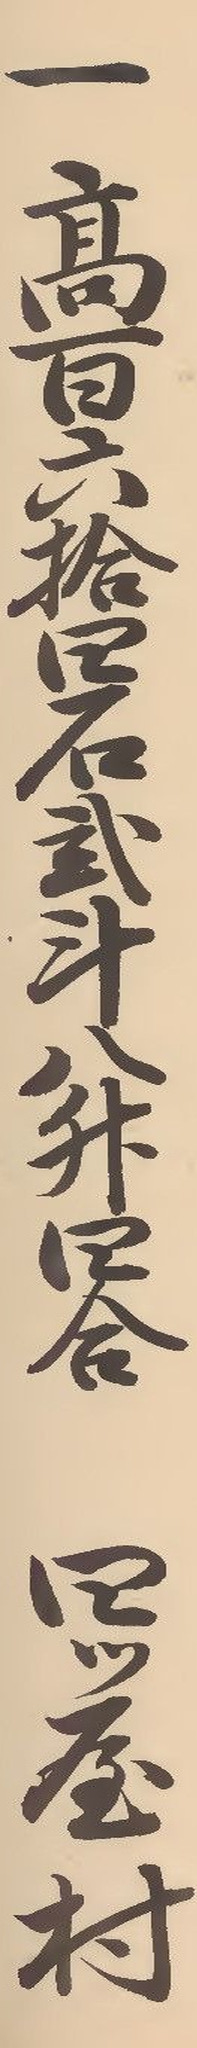一高百六拾四石弐斗八升四合四ッ屋村
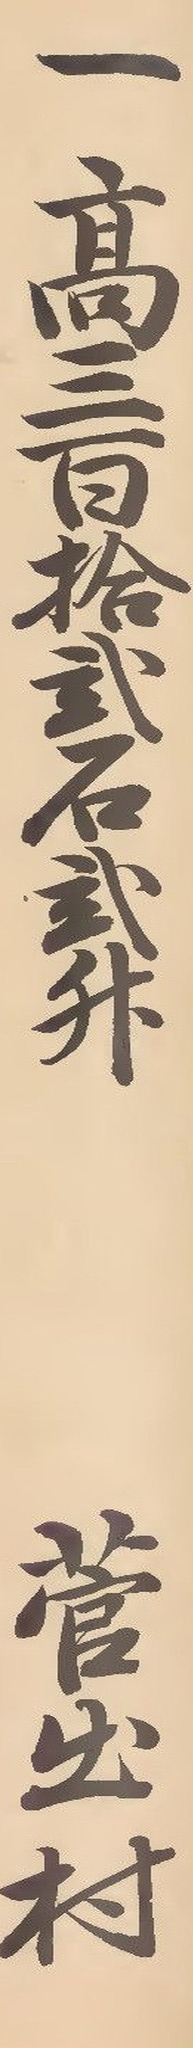一高三百拾弐石弐升菅出村
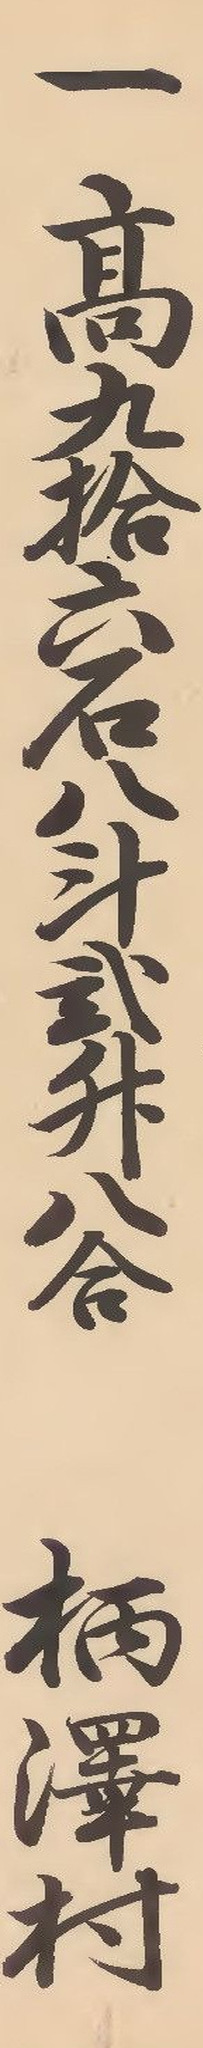一高九拾六石八斗弐升八合柄沢村
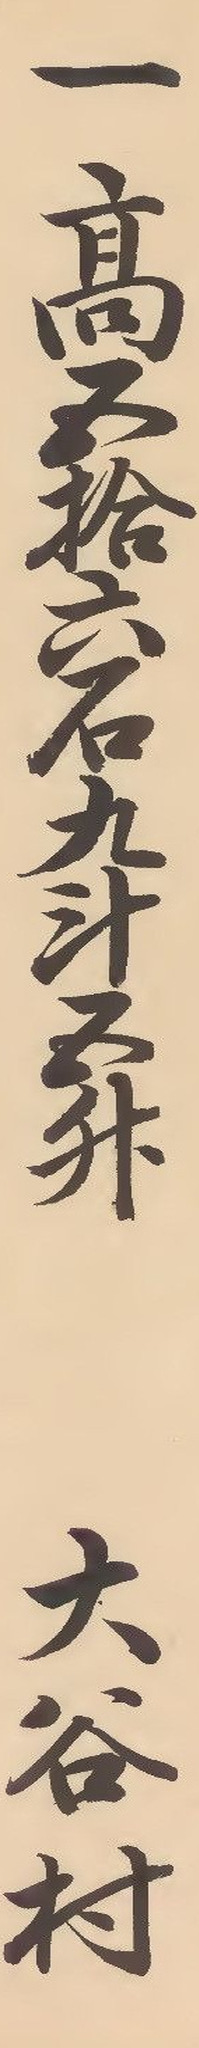一高五拾六石九斗五升大谷村
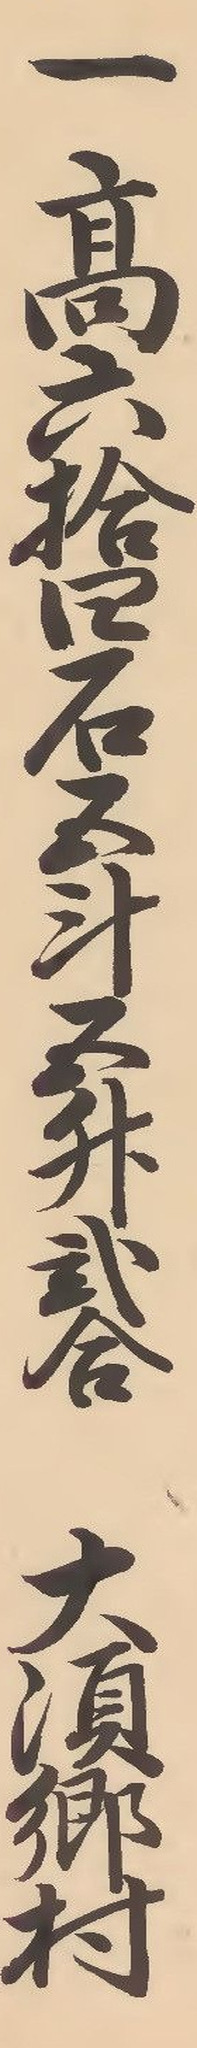一高六拾四石五斗五升弐合大須郷村

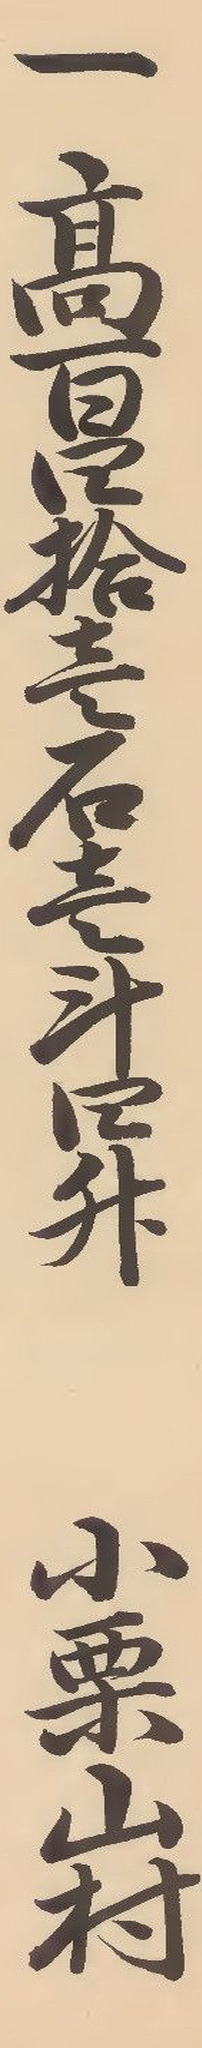一高百四拾壱石壱斗四升小栗山村
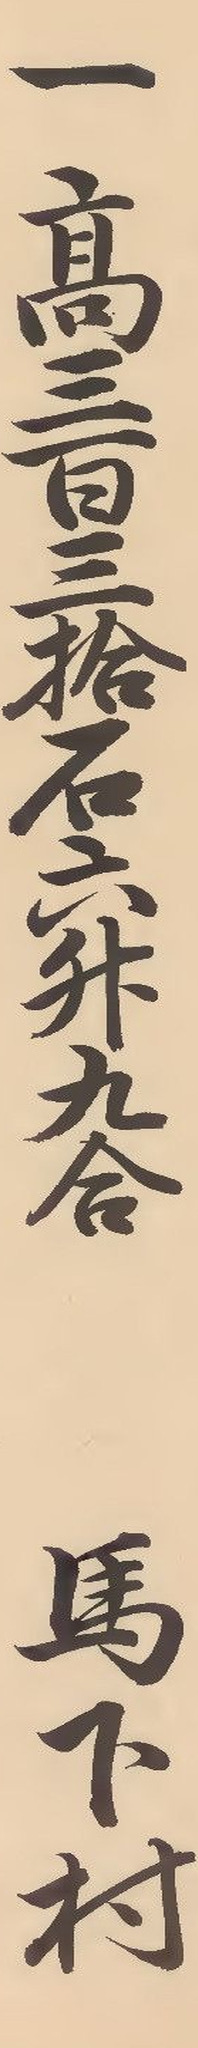一高三百三拾石六升九合馬下村
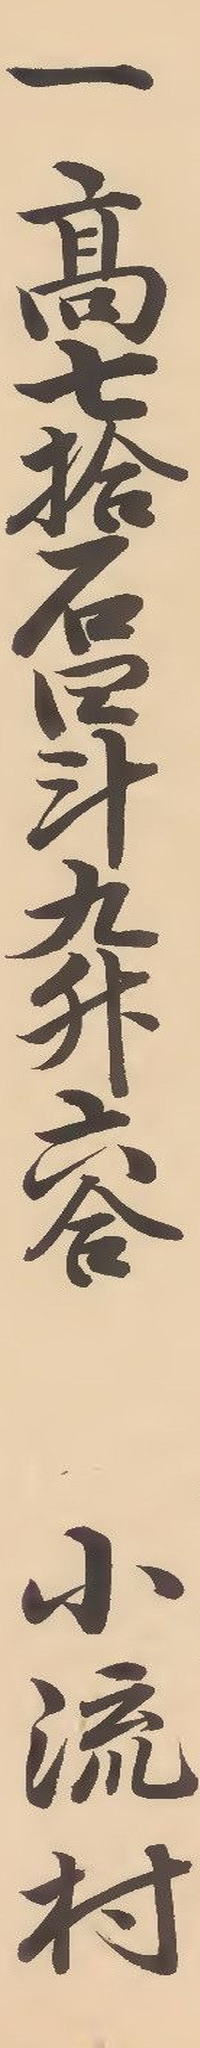一高七拾石四斗九升六合小流村
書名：越後国郷帳　下
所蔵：国立公文書館 National Archives of Japan
